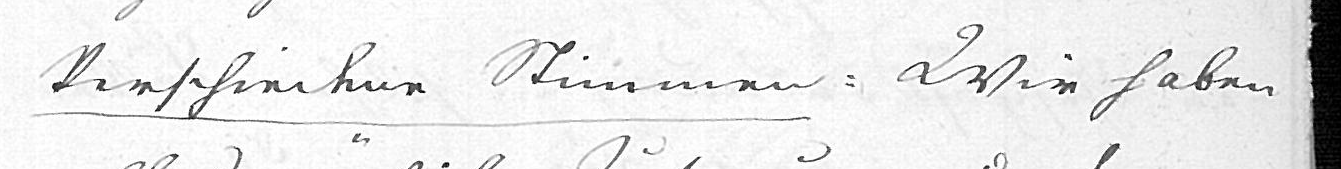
Verschiedene Stimmen: Wir haben
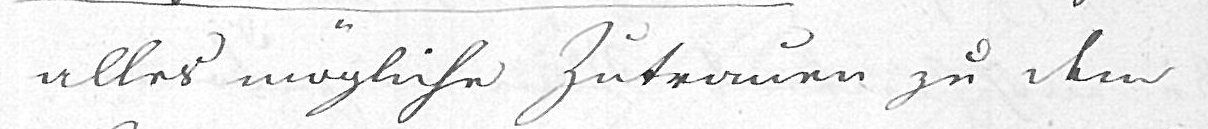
alles mögliche Zutrauen zu dem
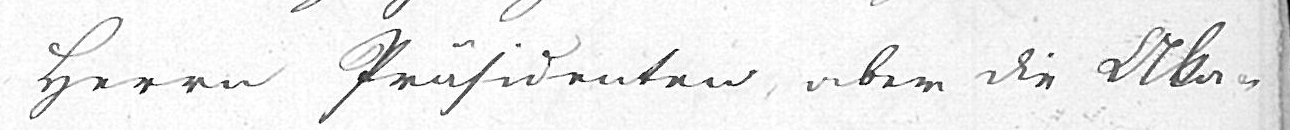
Herrn Präsidenten, aber die Aka-
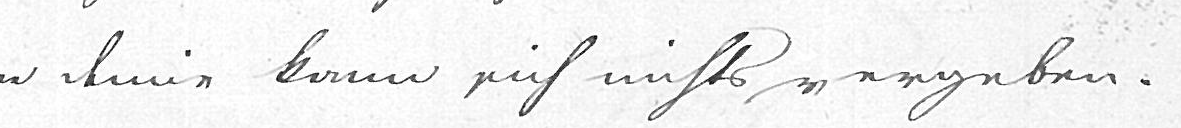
demie kann sich nichts vergeben.
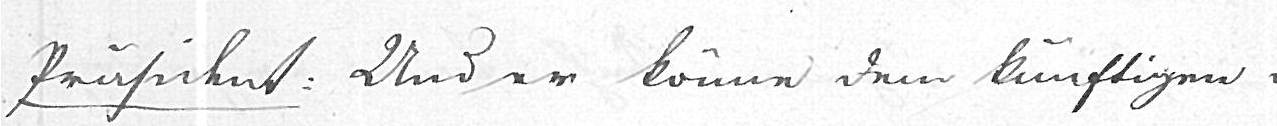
Präsident: Und er können dem Künftigen
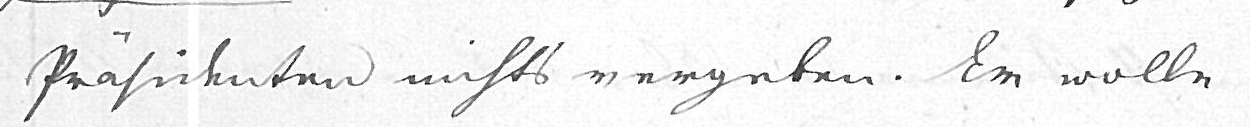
Präsidenten nichts vergeben. Er wolle
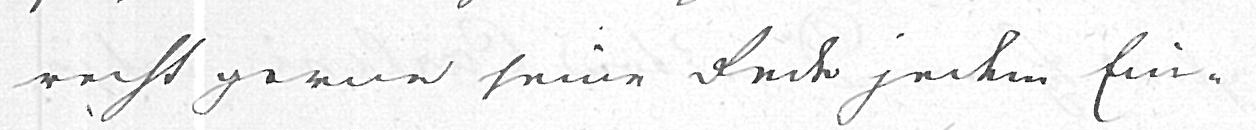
recht gerne seine Rede jedem Ein-
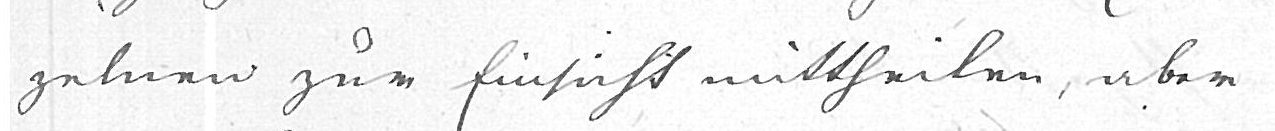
zelnen zur Einsicht mittheilen, aber
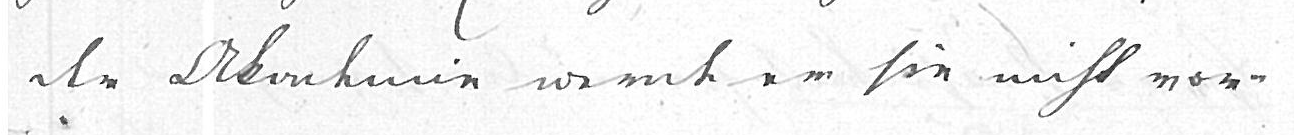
der Akademie werde er sie nicht vor-
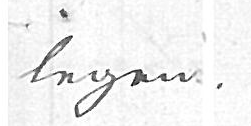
legen.
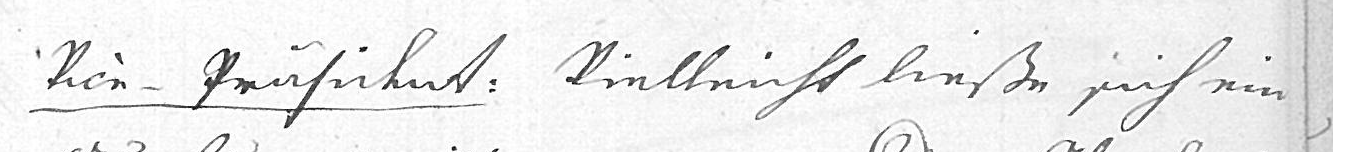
Vice-Präsident: Vielleicht ließe sich ein
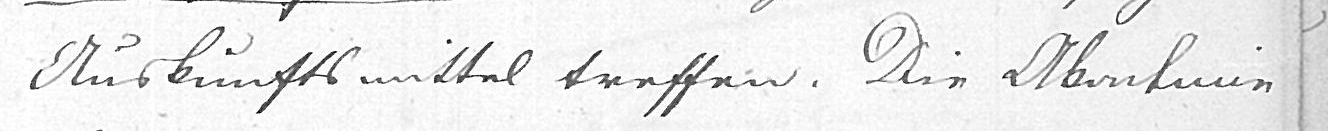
Auskunftsmittel treffen. Die Akademie
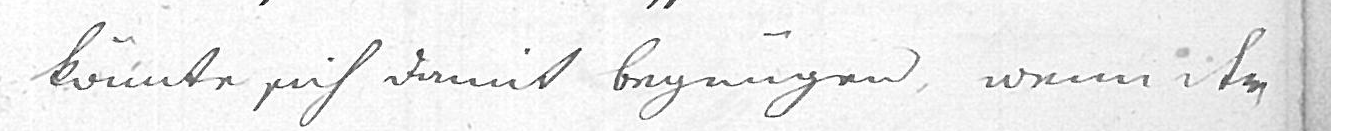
könnte sich damit begnügen, wenn der
